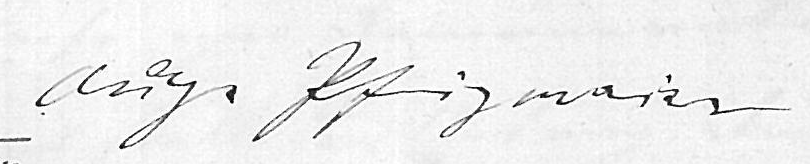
Aug. Pfizmaier
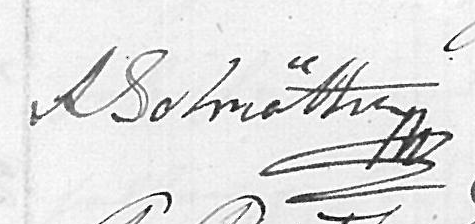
ASchrötter
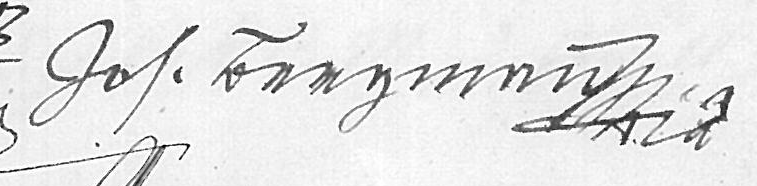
Jos. Bergmann
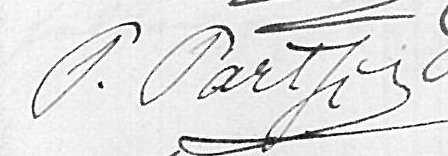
P. Partsch
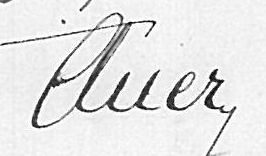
Auer
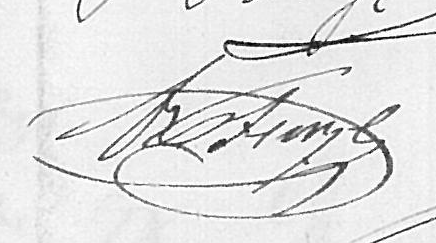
Ed. Fenzl
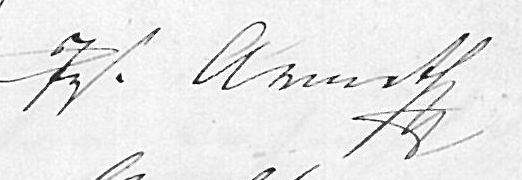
Jos. Arneth
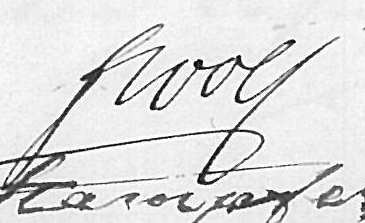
FWolf
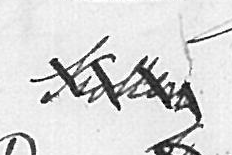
Koller
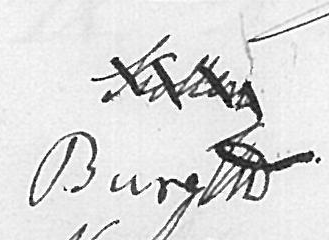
Burg
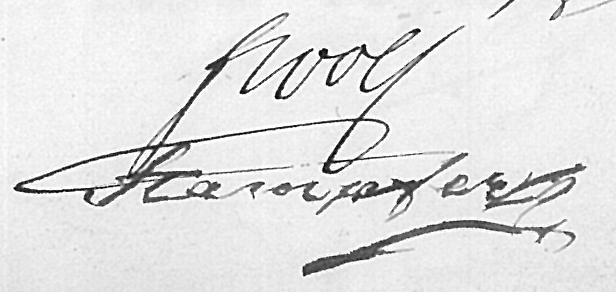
Stampfer
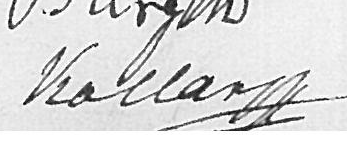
Kollar
